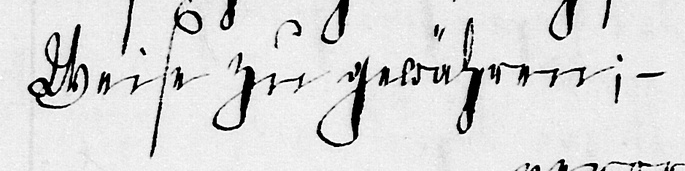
Weise zu gewähren; –
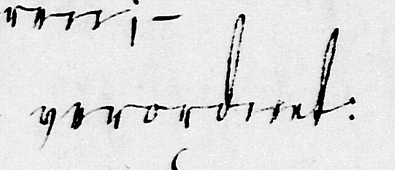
verordnet:
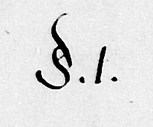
§. 1.
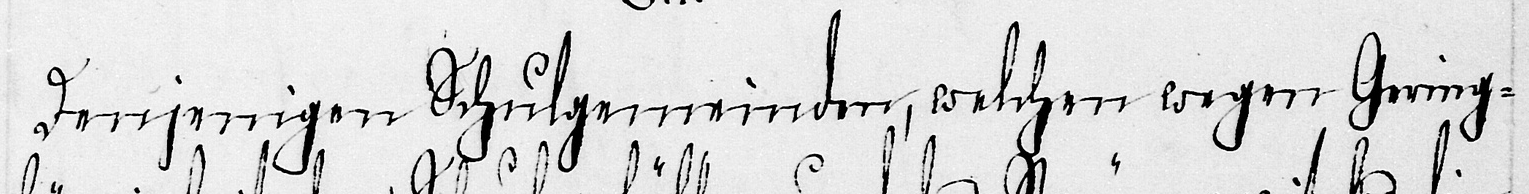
Denjenigen Schulgemeinden, welchen wegen Gering¬
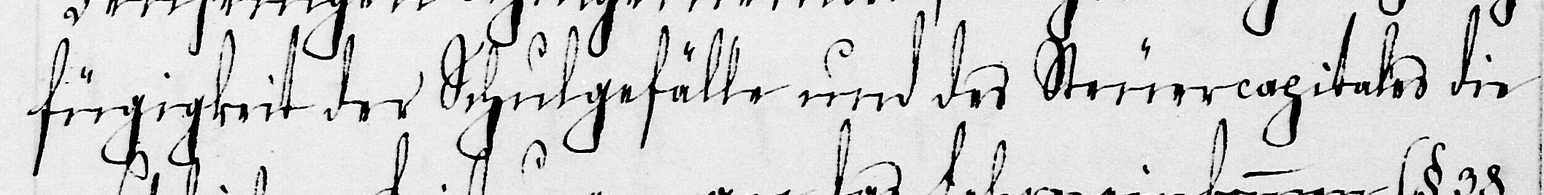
fügigkeit der Schulgefälle und des Steuercapitales die
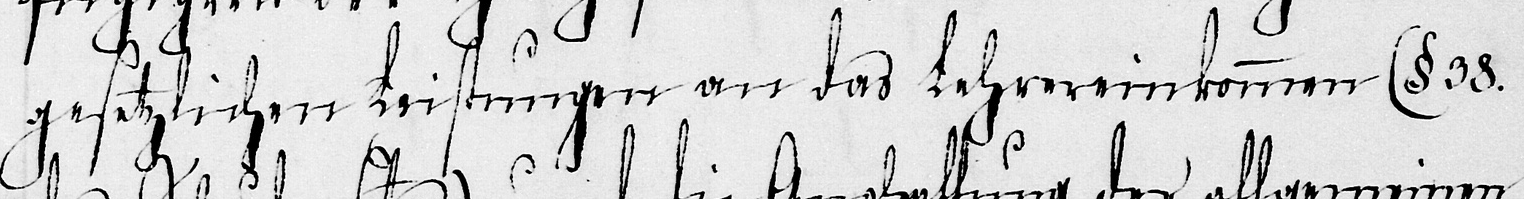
gesetzlichen Leistungen an das Lehrereinkommen ( § 38.
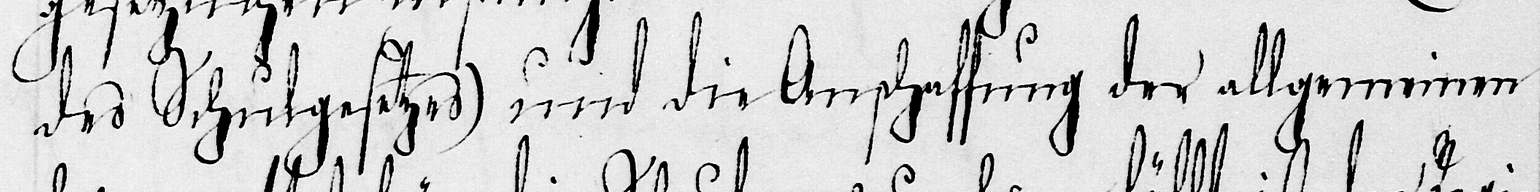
des Schulgesetzes) und die Anschaffung der allgemeinen
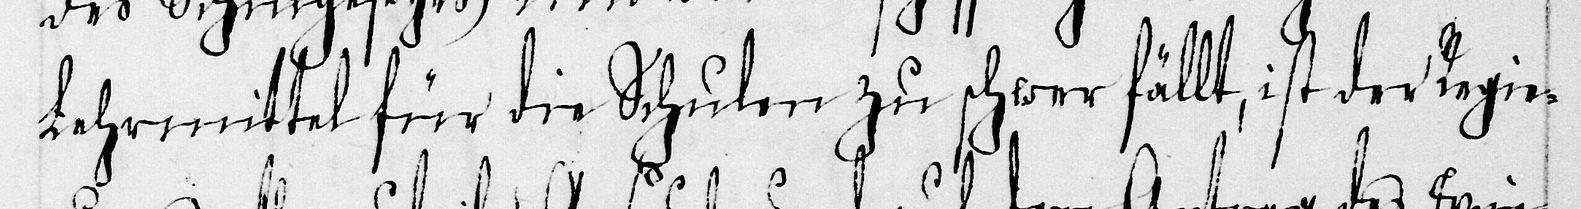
Lehrmittel für die Schulen zu schwer fällt, ist der Regi¬
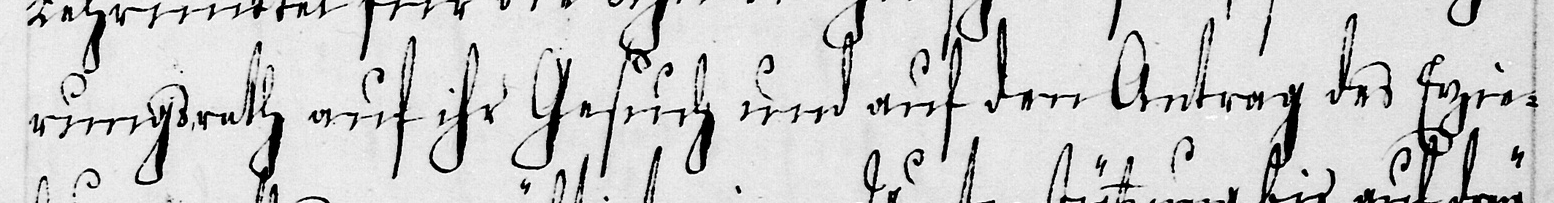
erungsrath auf ihr Gesuch und auf den Antrag des Erzie¬
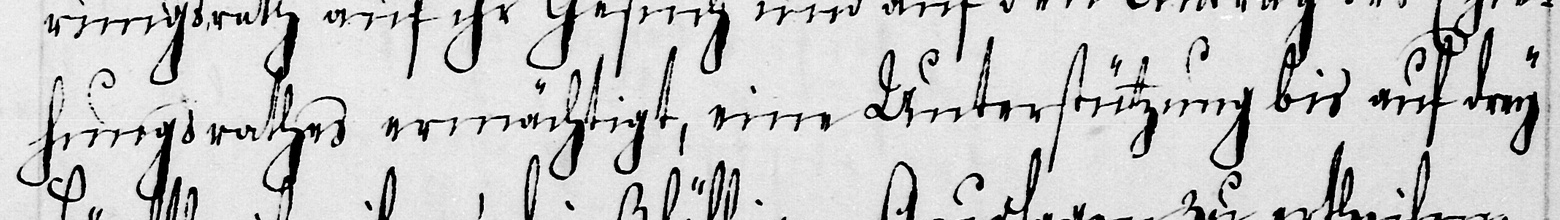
hungsrathes ermächtigt, eine Unterstützung bis auf drey
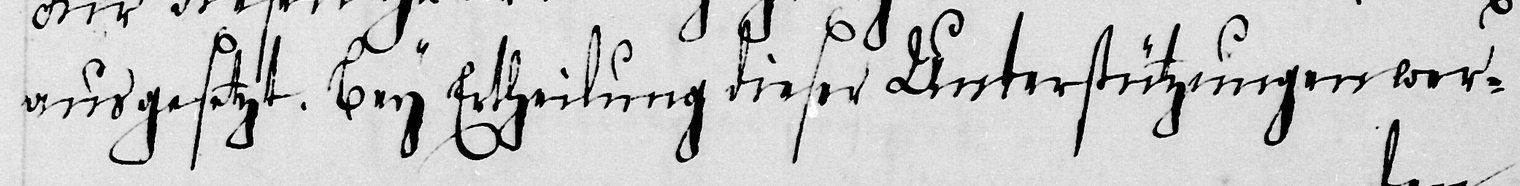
ausgesetzt. Bey Ertheilung dieser Unterstützungen wer-
